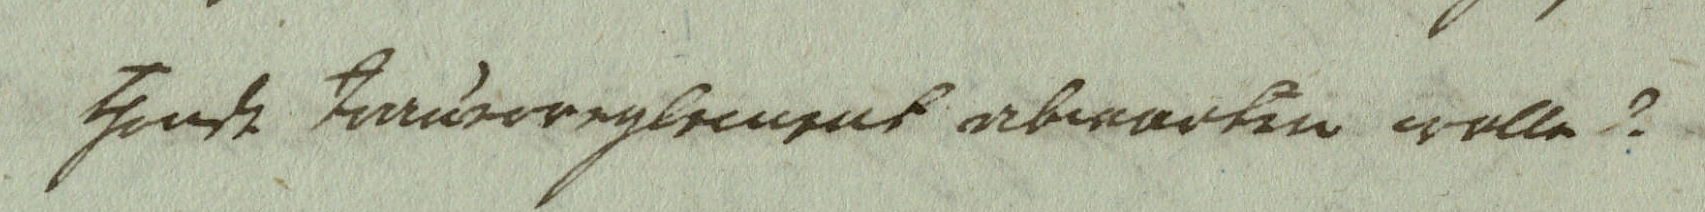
thende Trauerreglement abwarten wolle?
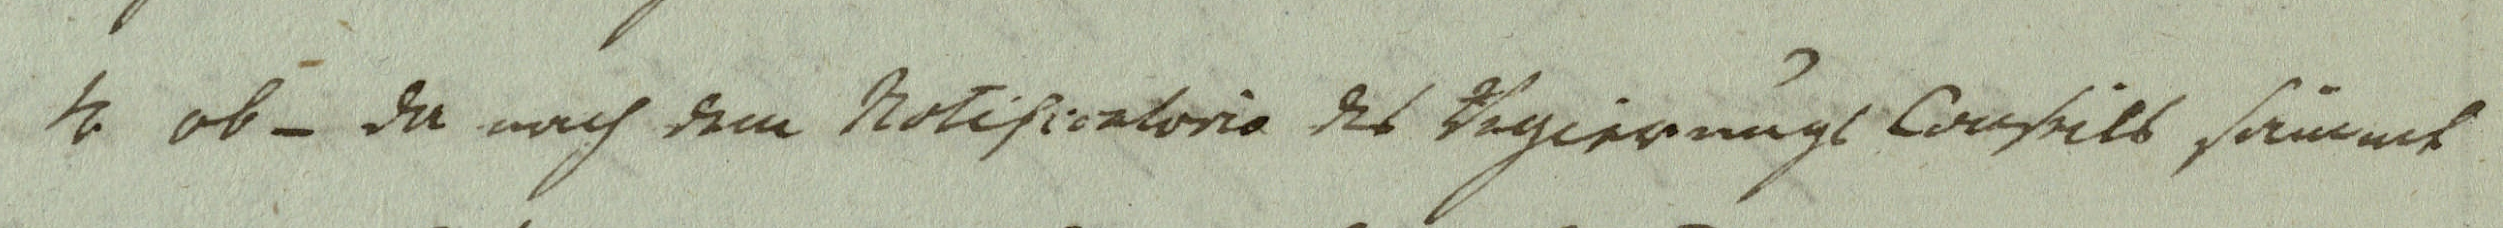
4, ob - da nach dem Notificatorio des Regierungs Conseils sämmt¬
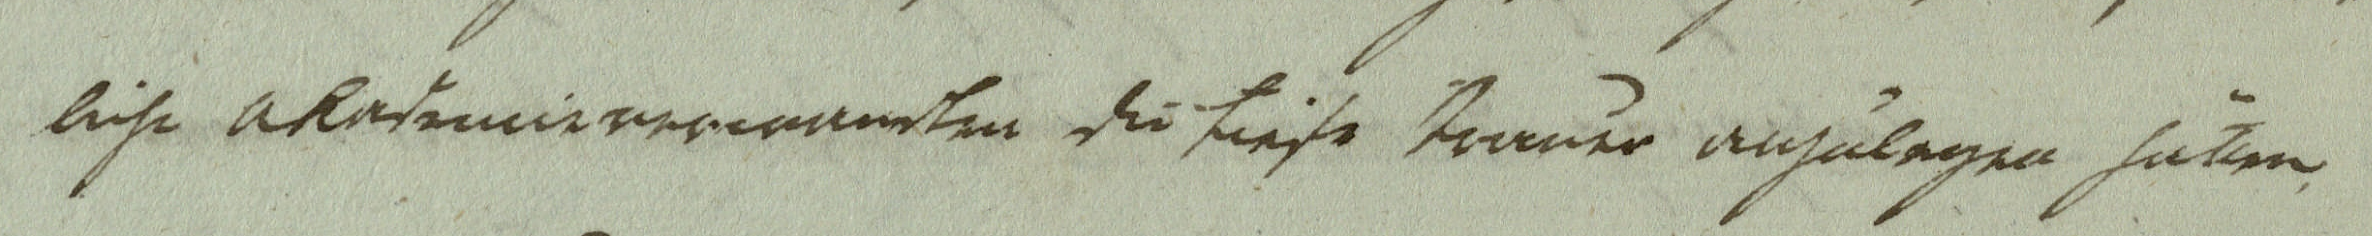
liche Akademieverwandten die tiefe Trauer anzulegen hätten
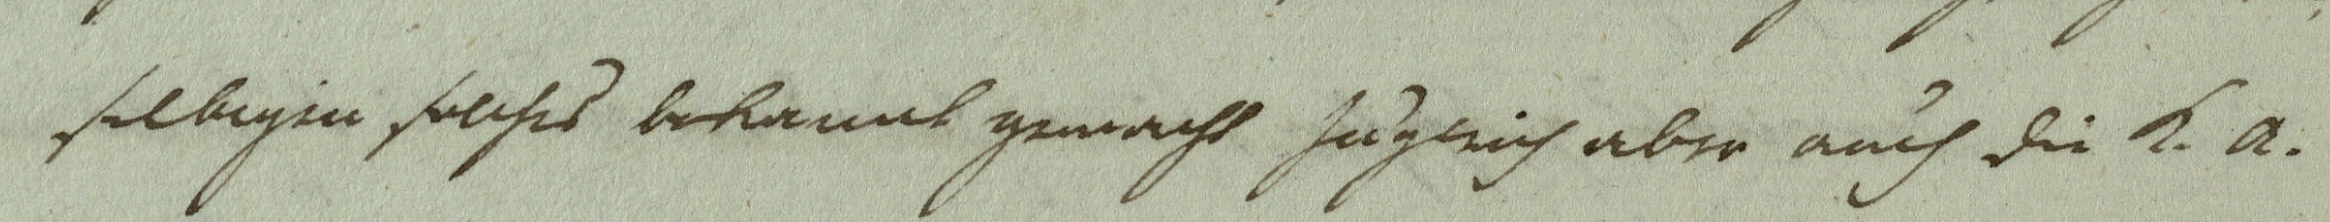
selbigen solches bekannt gemacht zugleich aber auch die K. A.
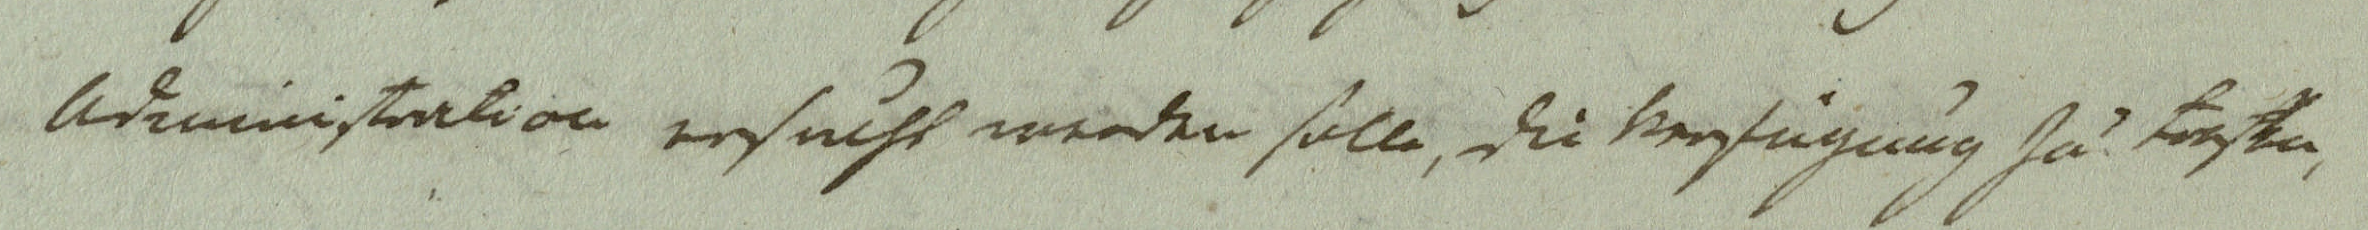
Administration ersucht werden solle, die Verfügung zu treffen,
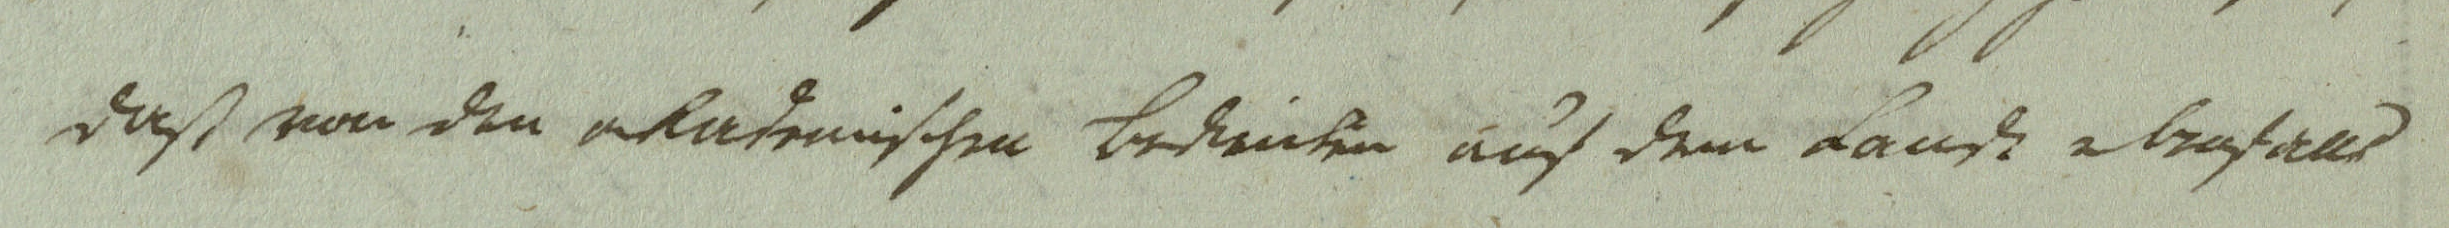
daß von den akademischen Bedienten auf dem Lande ebenfalls
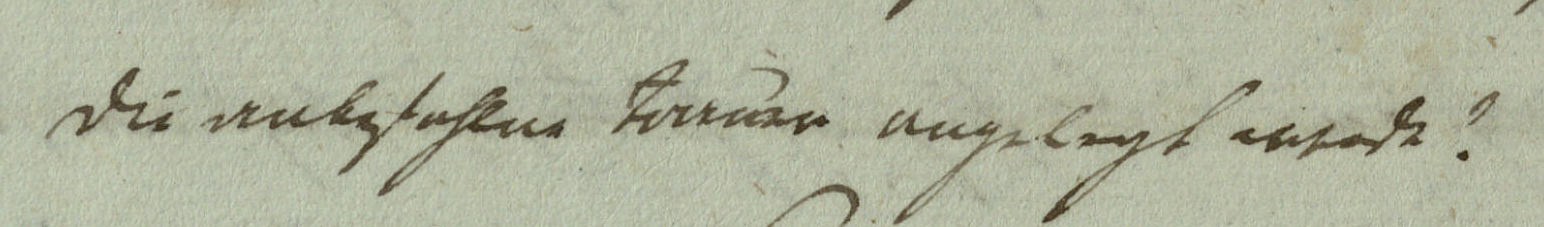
die anbefohlne Trauer angelegt werde?
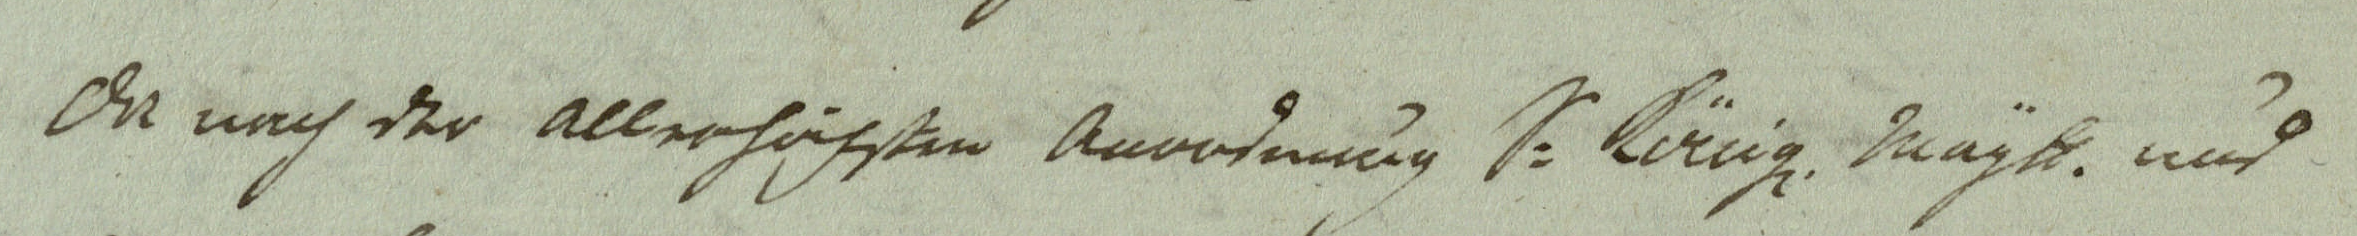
Da nach der Allerhöchsten Anordnung Sr. Königl. Maÿtt. und
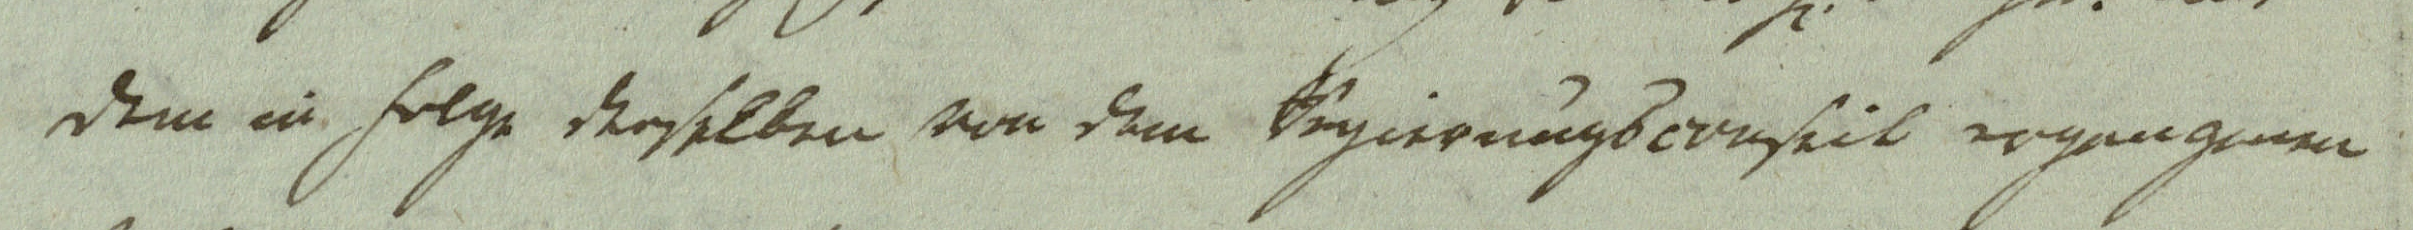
dem in Folge derselben von dem Regierungsconseil ergangenen
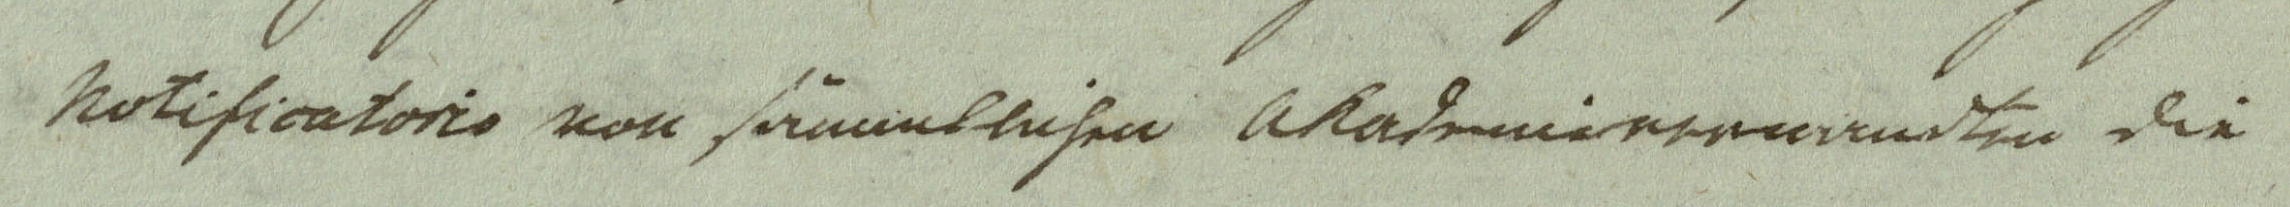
Notificatorio von sämmtlichen Akademieverwandten die
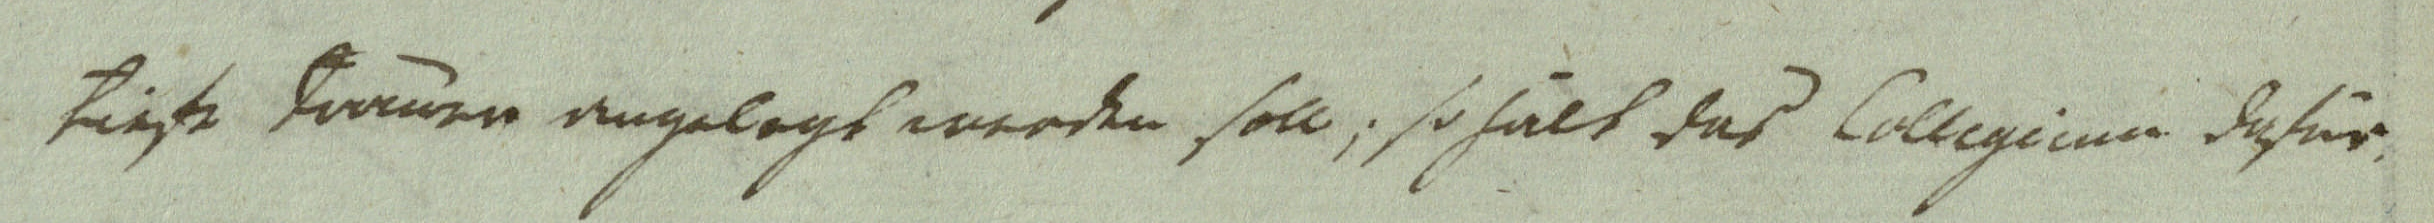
tiefe Trauer angelegt werden soll, so hält das Collegium dafür
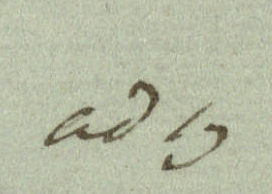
ad 1.
